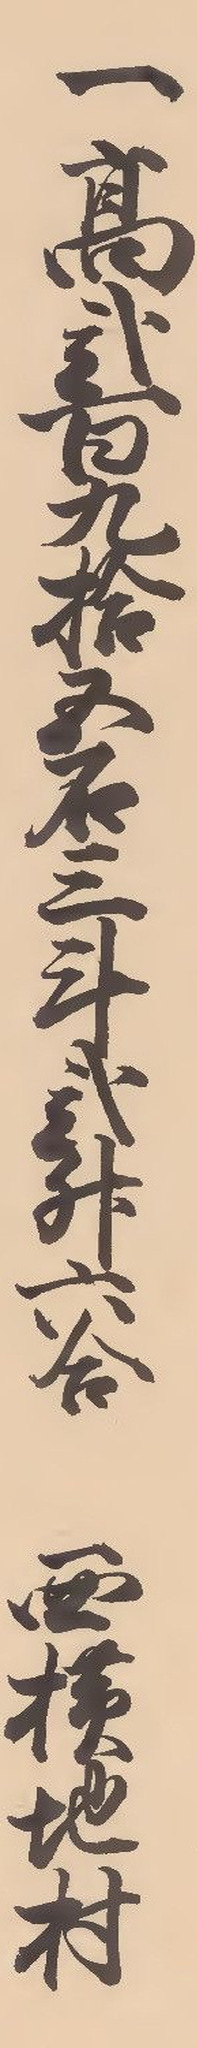一高弐百九拾五石三斗弐升六合西横地村
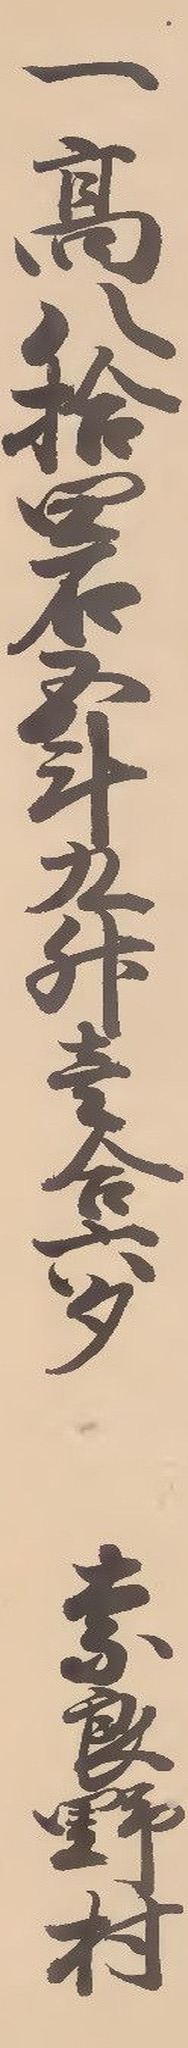一高八拾四石五斗九升壱合六勺奈良野村
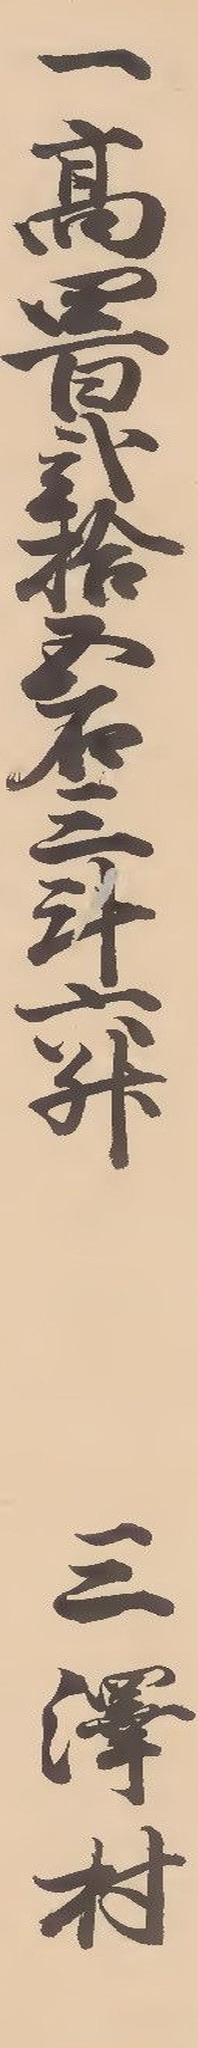一高四百弐拾五石三斗六升三沢村
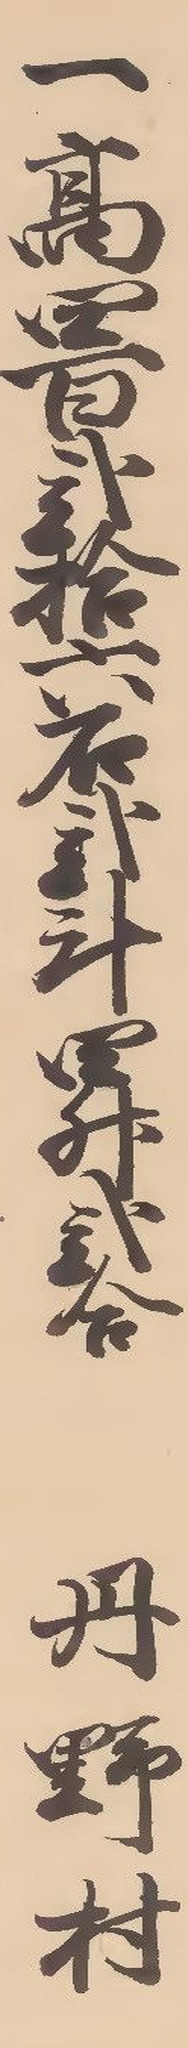一高四百弐拾六石弐斗四升弐合丹野村
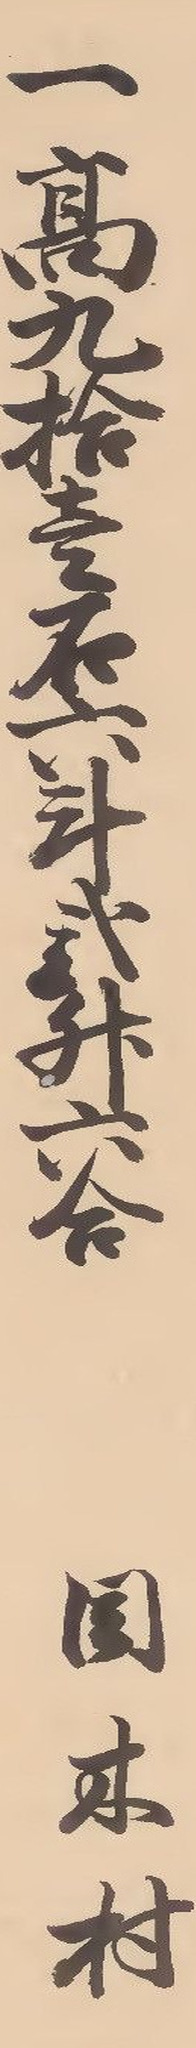一高九拾壱石六斗弐升六合目木村

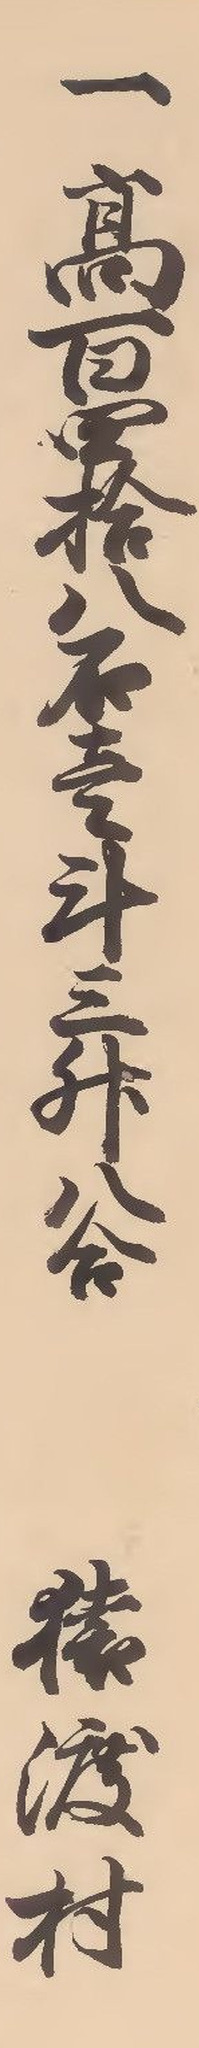一高百四拾八石壱斗三升八合猿渡村
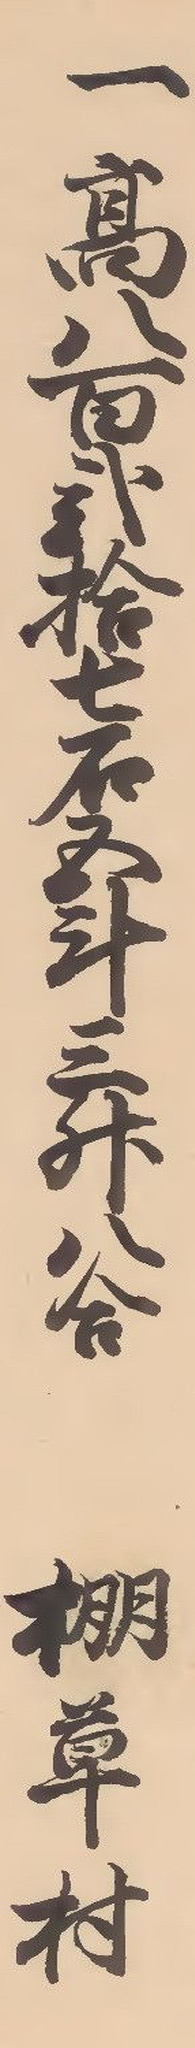一高八百弐拾七石五斗三升八合棚草村
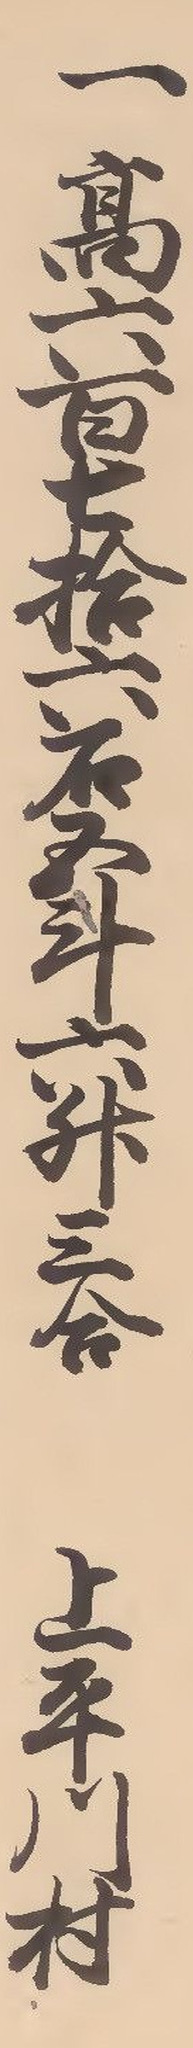一高六百七拾六石五斗六升三合上平川村
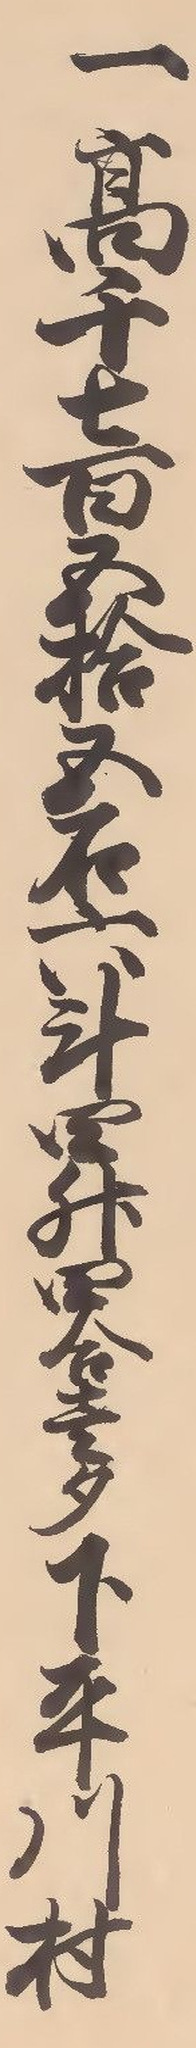一高千七百五拾五石六斗四升四合壱勺下平川村
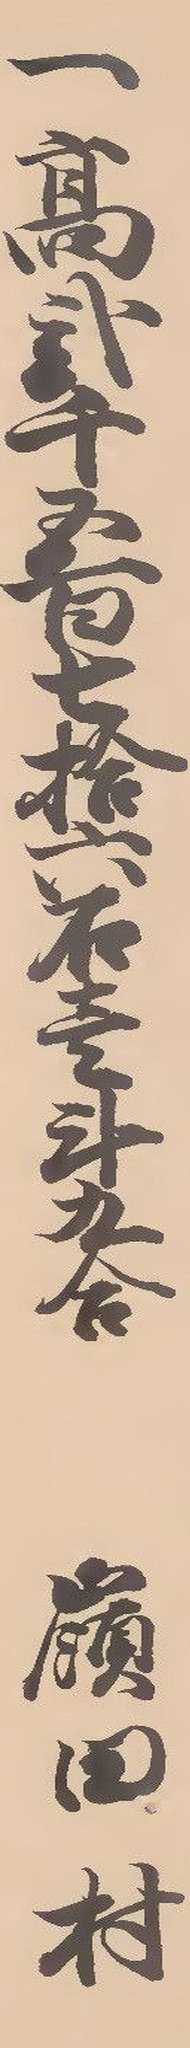一高弐千五百七拾六石壱斗九合嶺田村
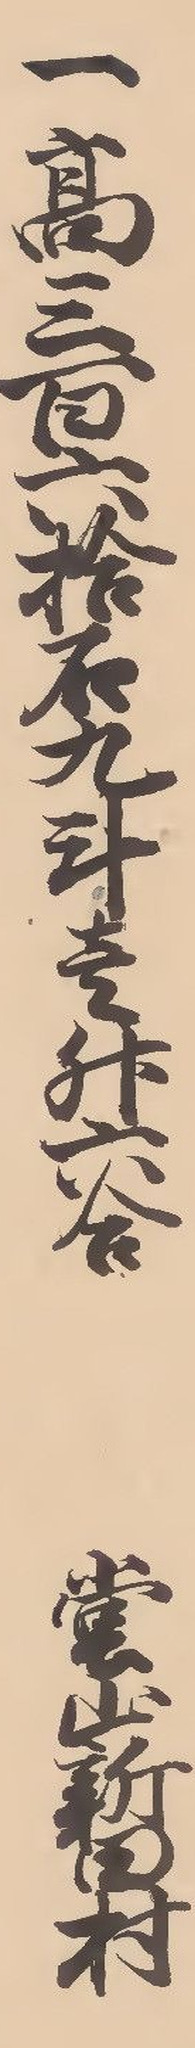一高三百六拾石九斗壱升六合堂山新田村
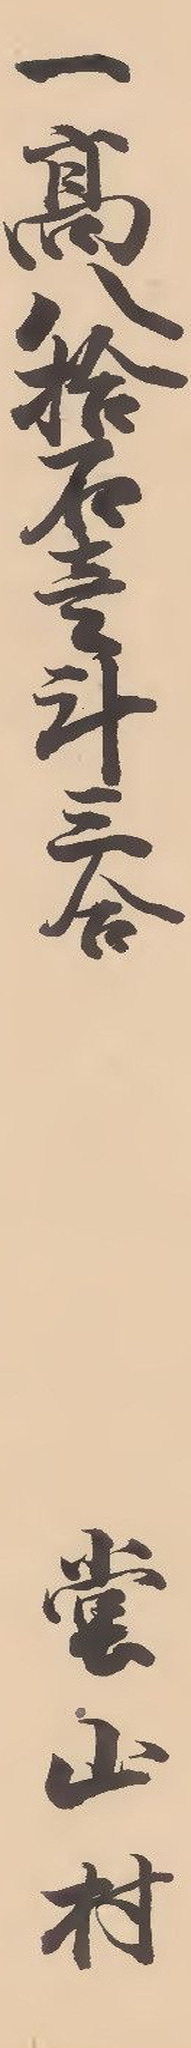一高八拾石壱斗三合堂山村
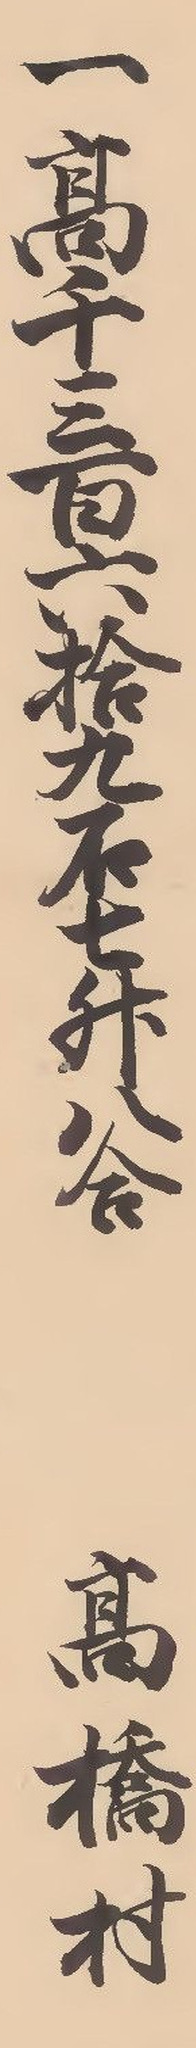一高千三百六拾九石七升八合高橋村

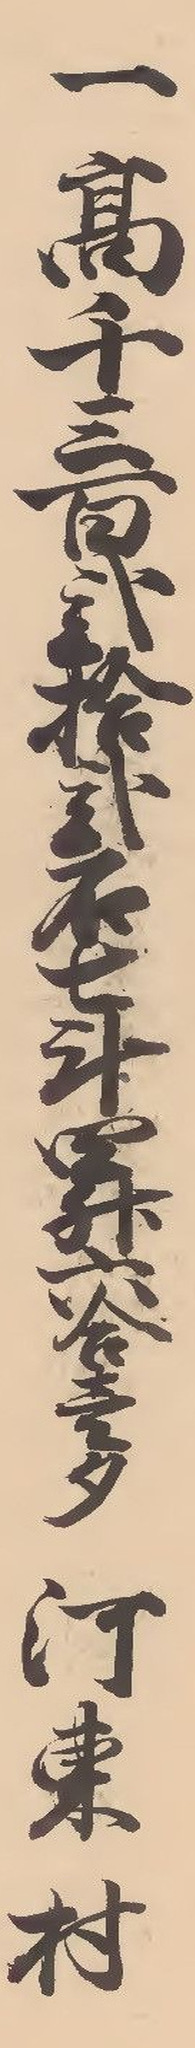一高千三百弐拾弐石七斗四升六合壱勺河東村
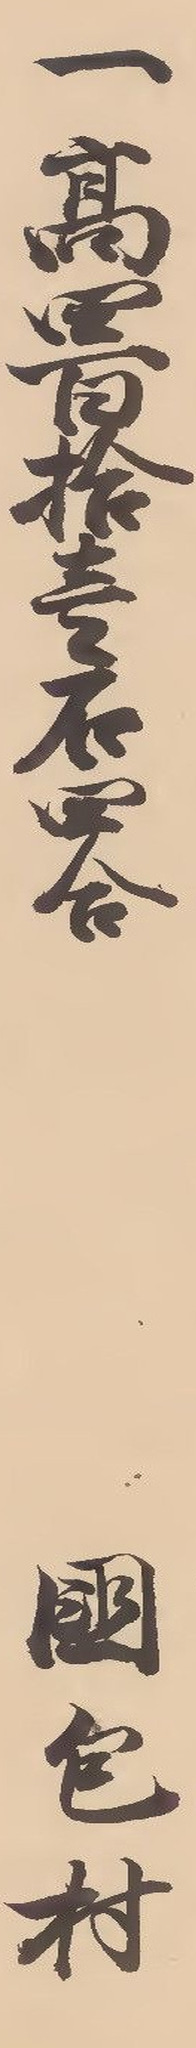一高四百拾壱石四合国包村
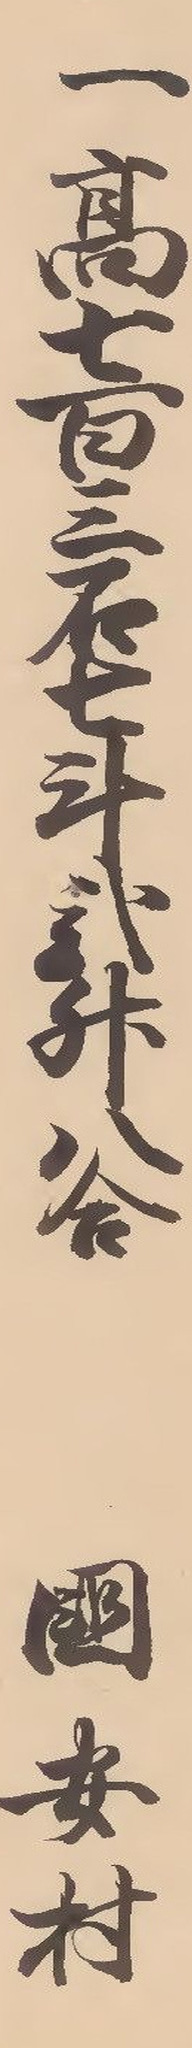一高七百三石七斗弐升八合国安村
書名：遠江国郷帳
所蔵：国立公文書館 National Archives of Japan
